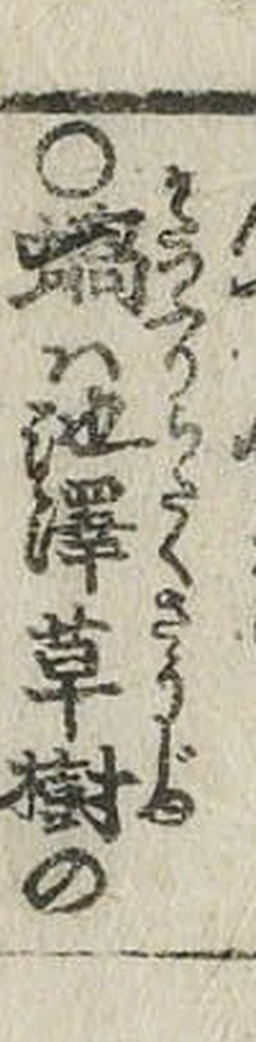○蝸は池沢草樹の
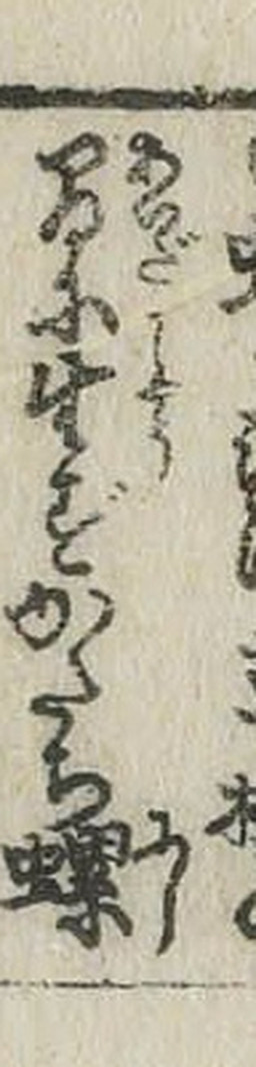間に生ずかたち螺

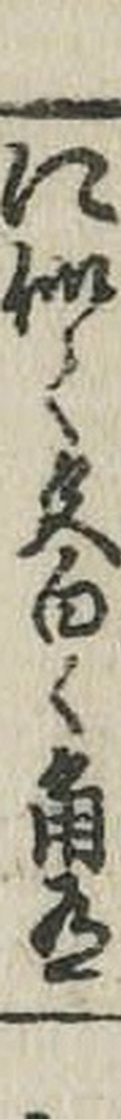に似て色白く角有
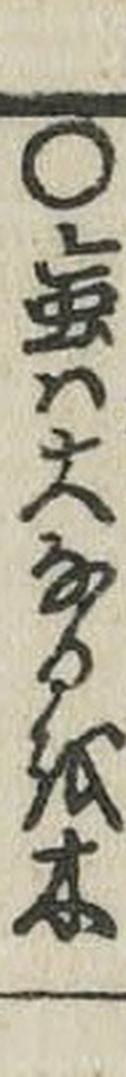○䖟は大なるを木
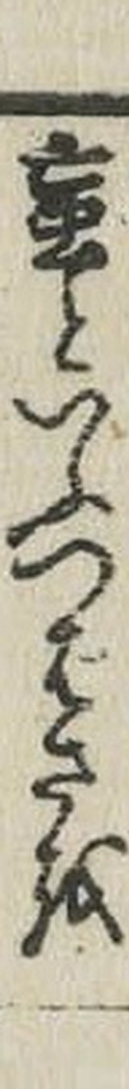䖟といふつばさを
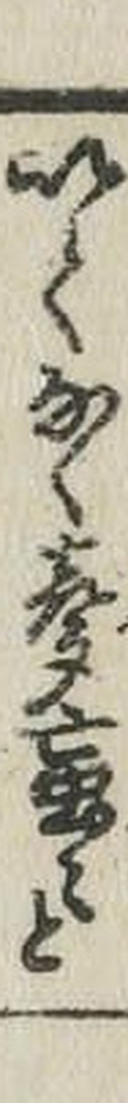以てなく声䖟々と
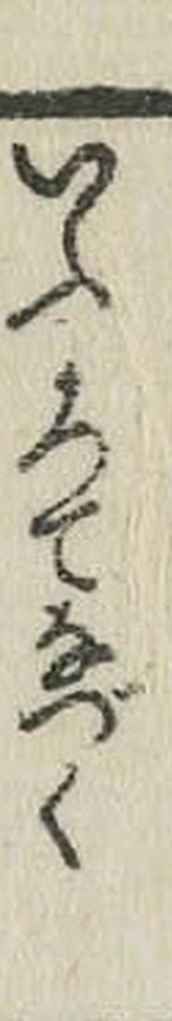いふよつてなづく
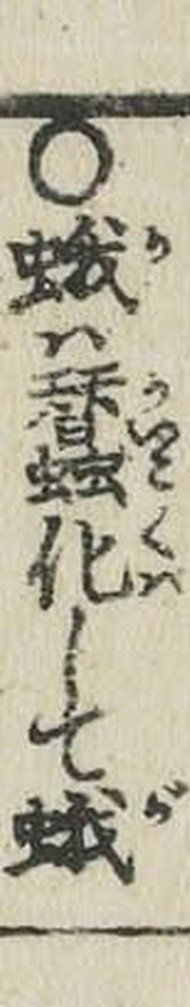○蛾は蚕化して蛾
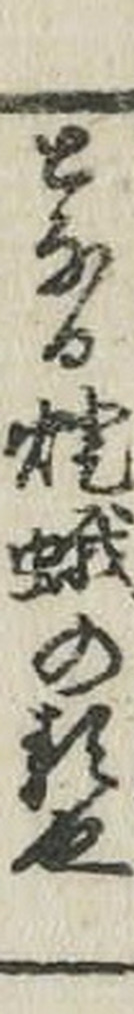となる灯蛾の類也
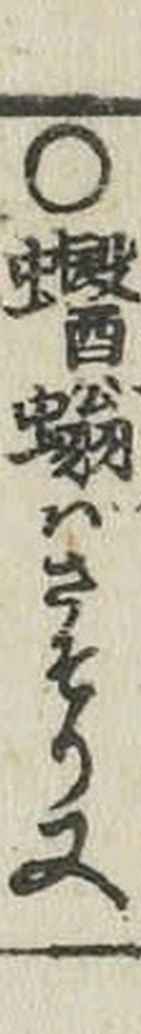○𧕪螉はさそり又
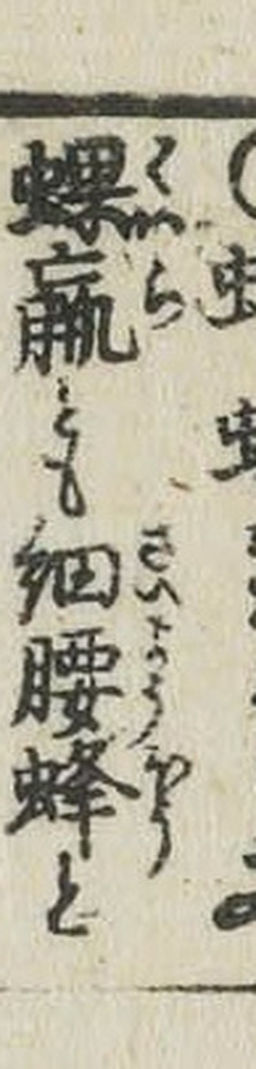螺羸とも細腰蜂と
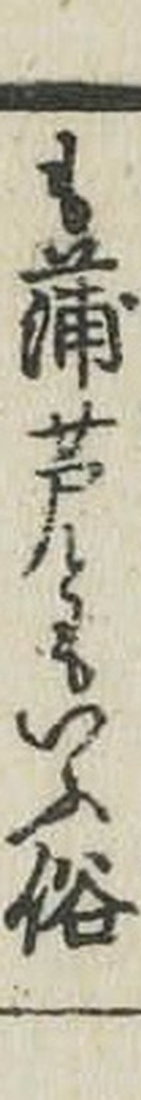も蒲芦ともいふ俗
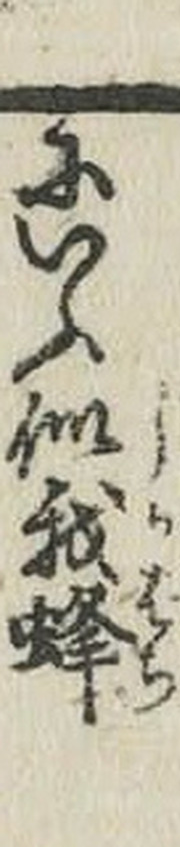にいふ似我蜂。
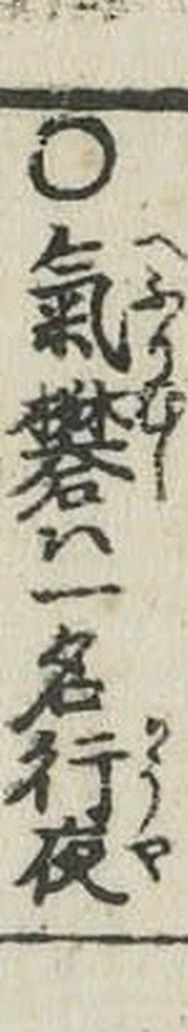○気礬は一名行夜
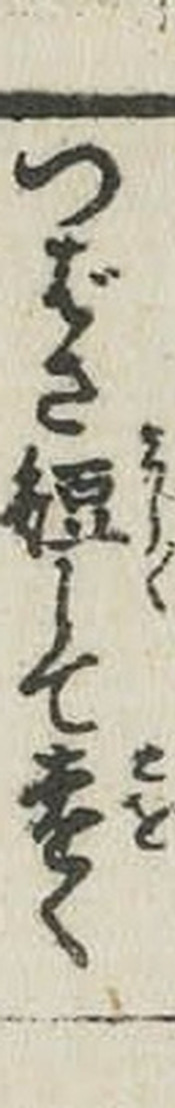つばさ短して遠く
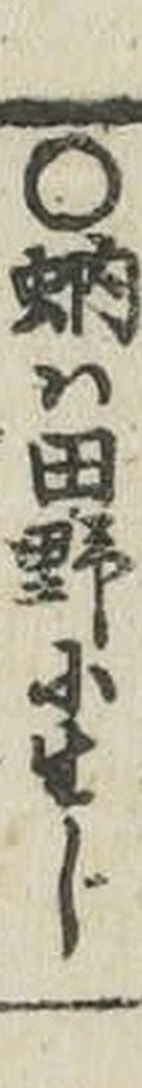○蚋は田野に生じ
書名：増補頭書訓蒙図彙大成 10巻 7:巻之14-16
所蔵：東京学芸大学教育コンテンツアーカイブ
